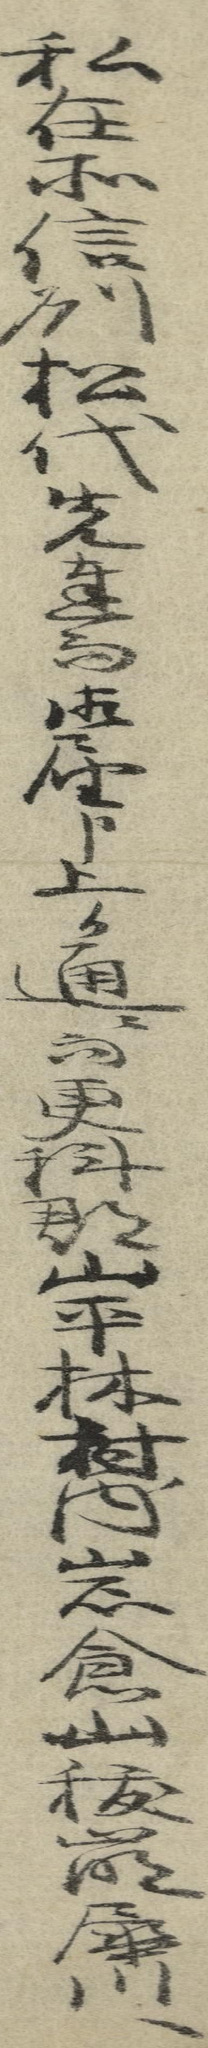一私在所信州松代先達而御届申上候通二而更科郡山平林村ノ内岩倉山拔崩犀川へ
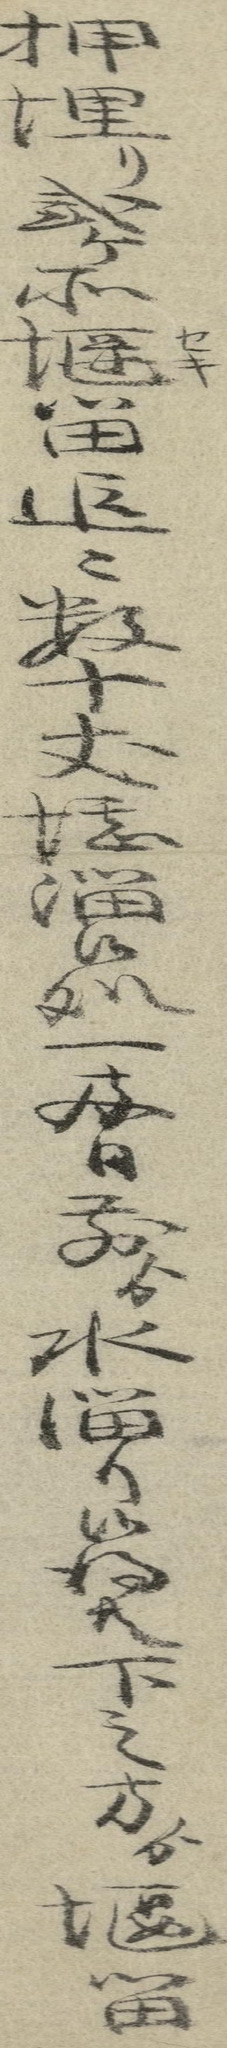押埋り弐ケ所堰留追々数十丈堪溜候処一両日前ゟ水溜り候得共下之方ゟ堰留
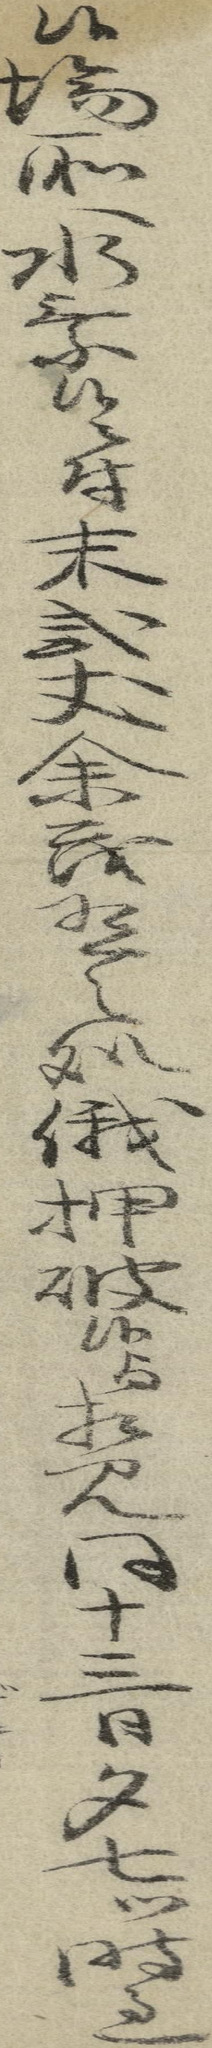候場所へ水乗候二付末弐丈余茂有之候処俄押破候而相見同十三日夕七ツ時過
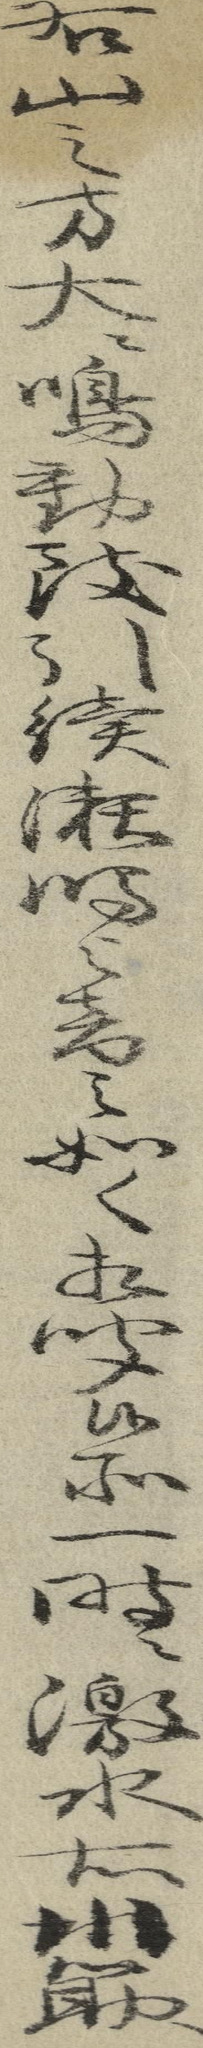右山之方大ニ鳴動致引続瀬鳴之音之如く相聞候所一時ニ激水右川筋ヘ
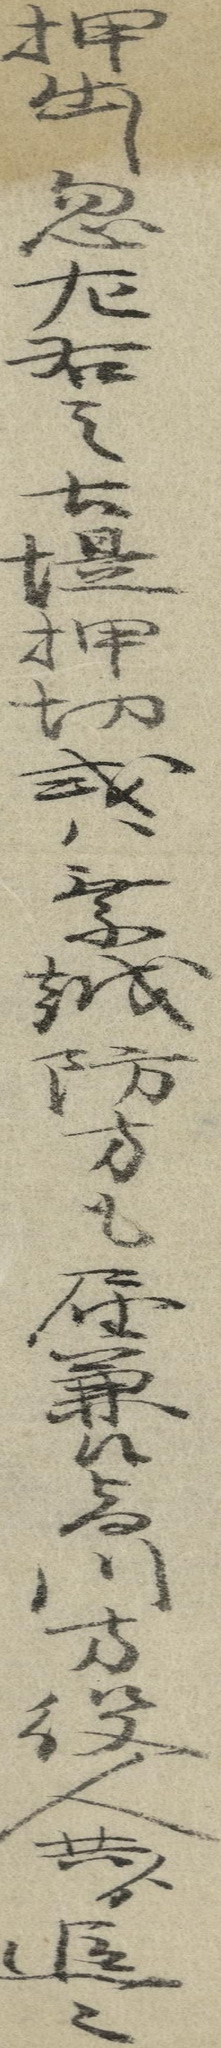押出し忽左右之古堤押切或ハ乗越防方も届兼候旨川方役人共ゟ追々
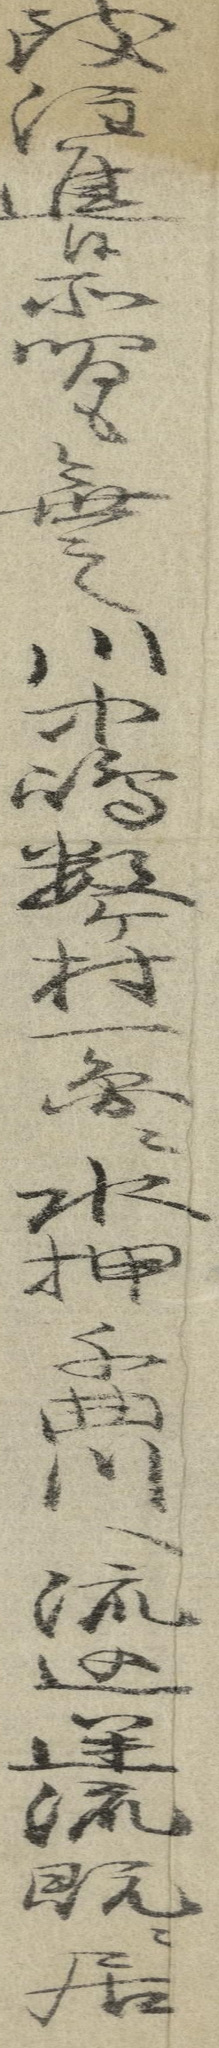致注進候所間も無之川中嶋数ケ村一圓ニ水押千曲川ヘ流込逆流既ニ居
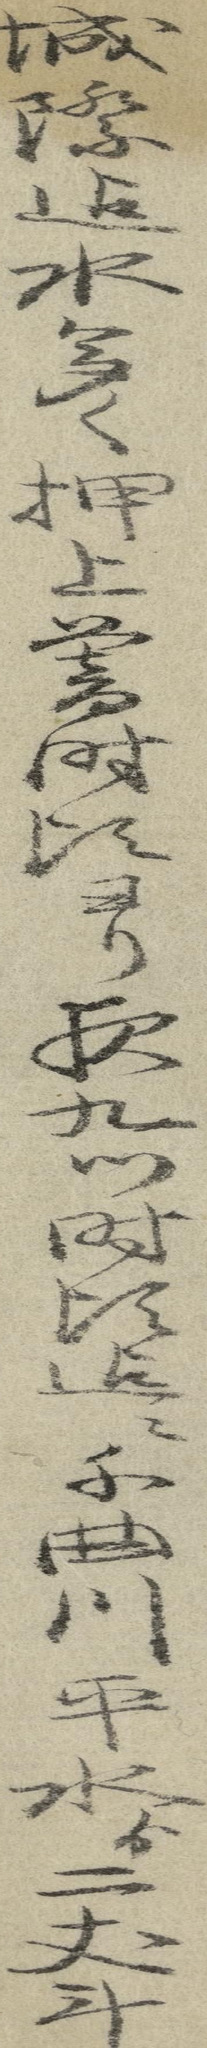城際迄水多く押上暮時頃ヨリ夜九ツ時頃迄ニ千曲川平水ゟニ丈斗
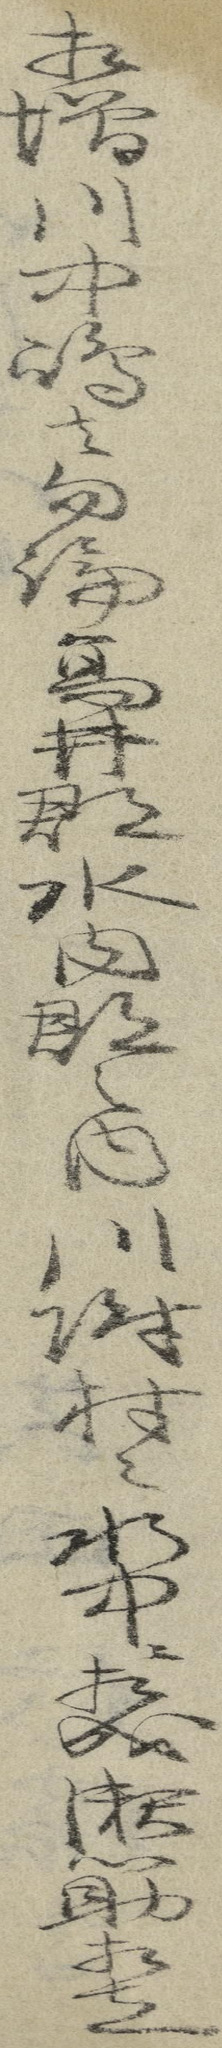相増川中嶋者勿論高井郡水内郡之内川附村々水中ニ相成瀬筋相立
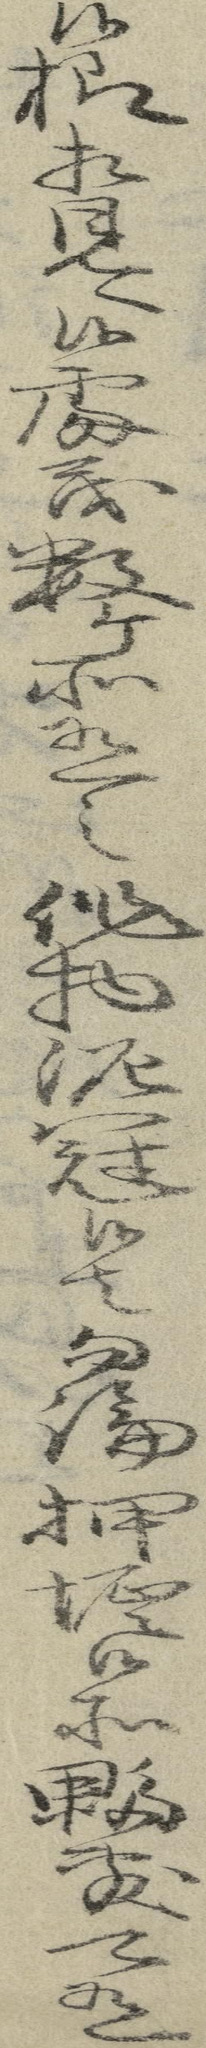候様相見ㇸ候處も数ケ所有之作物泥冠候者勿論押壊候所夥敷可有
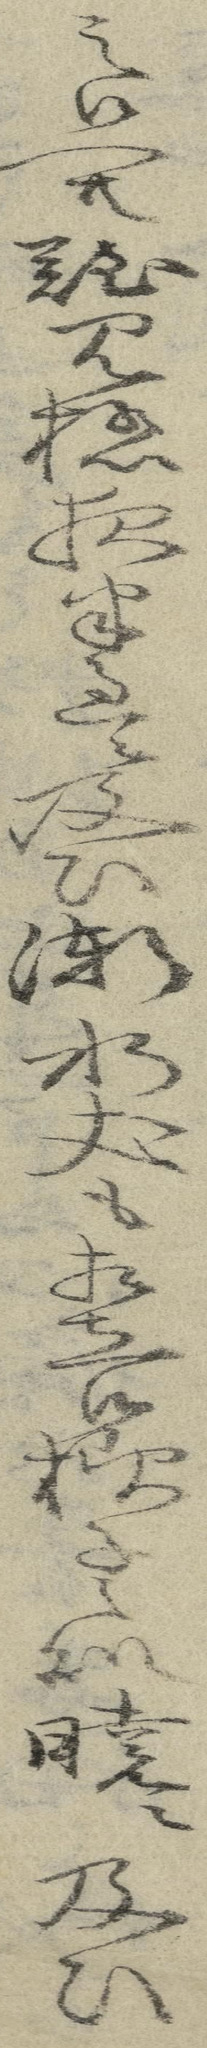之候へ共難見極夜半過ニ及ひ瀬水丈も相立候様子の処暁ニ及ひ
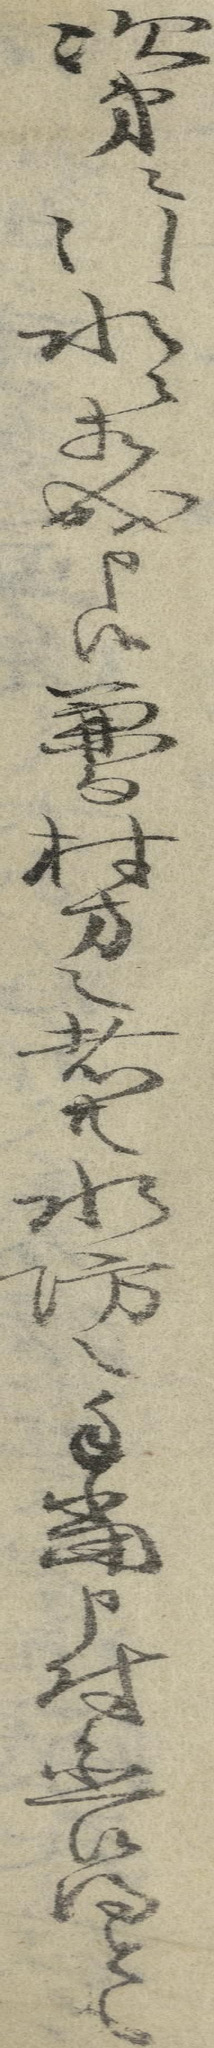次第ニ引水ニ相成申候兼而村方之者共水防之手当申付置候得とも

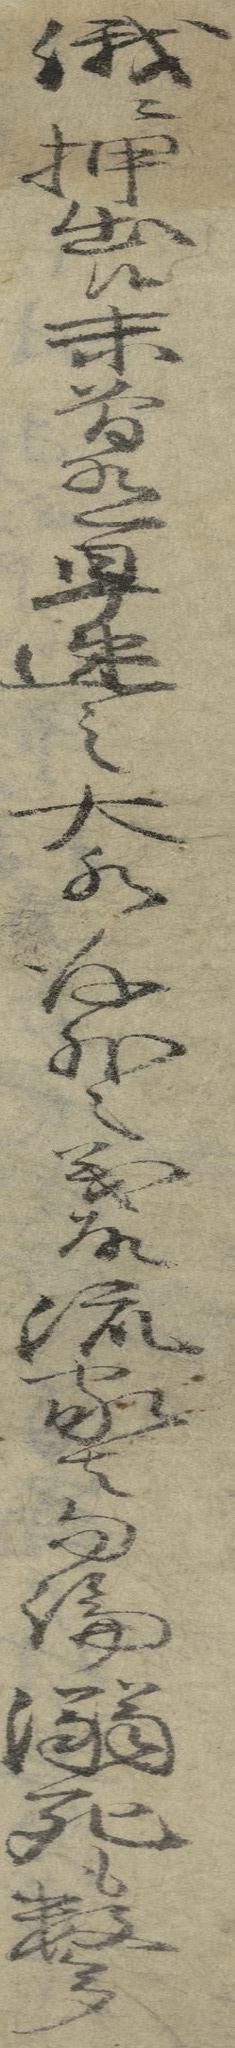俄ニ押出候末曾有早速之大水存外之義故流家者勿論溺死も数多
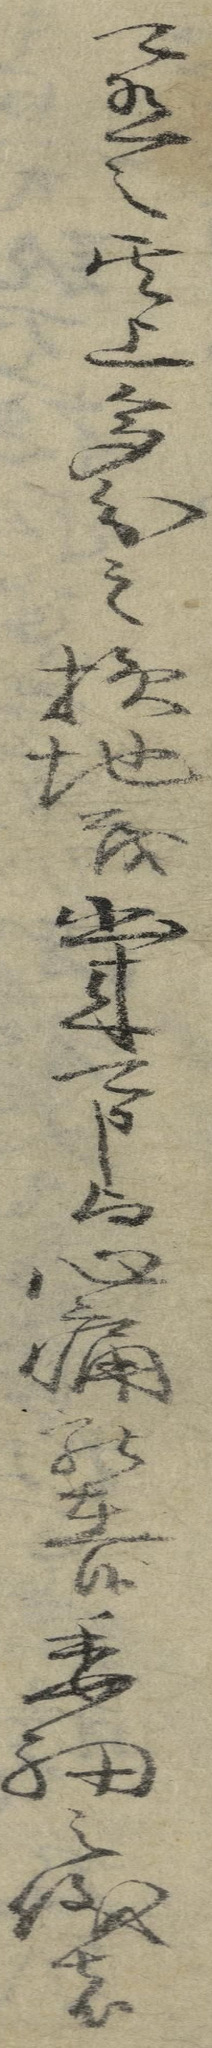可有之其上多分之損地茂出来可申と心痛罷在候委細之義者
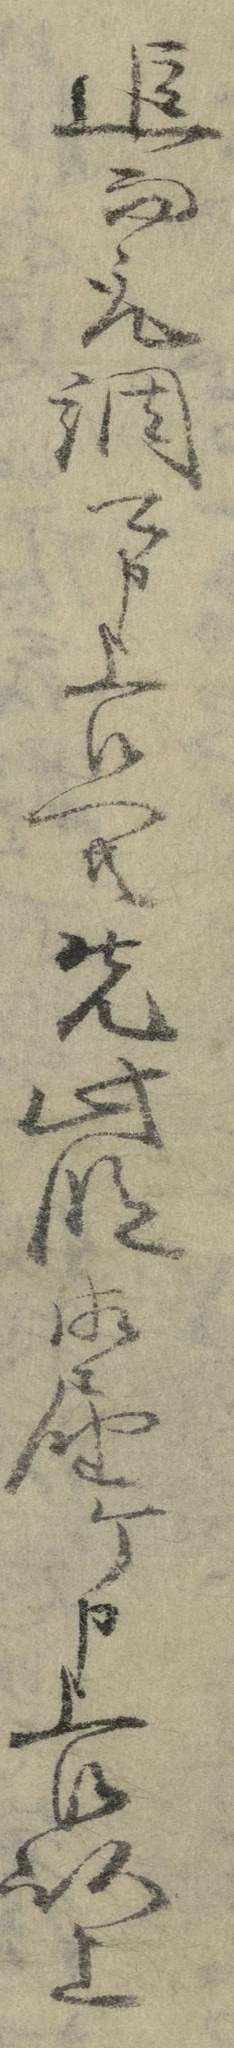追而取調可申上候へ共先此段御届ケ申上候以上
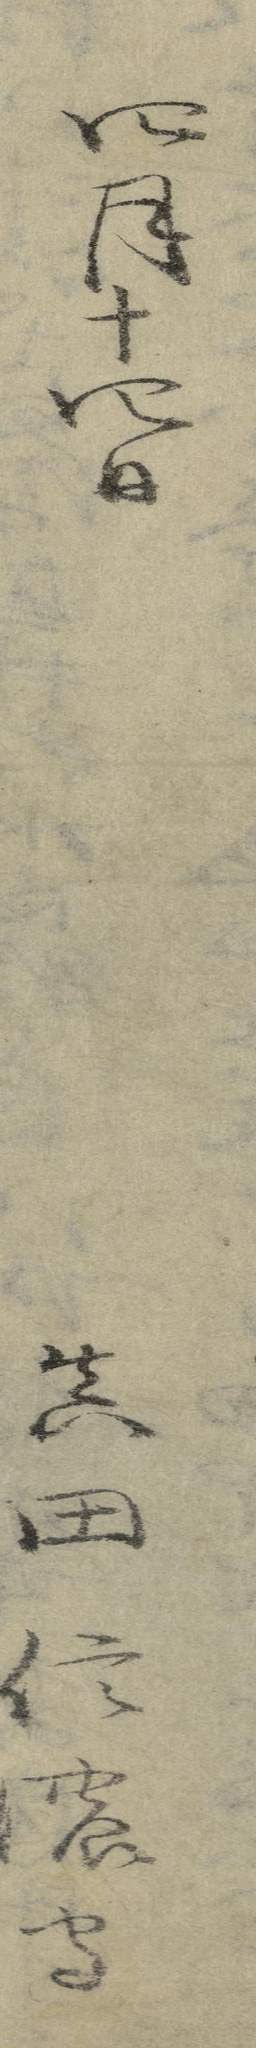四月十四日真田信濃守
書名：[善光寺地震被害書上]
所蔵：東京大学地震研究所図書室 Earthquake Research Institute Library, The University of Tokyo, JAPAN
